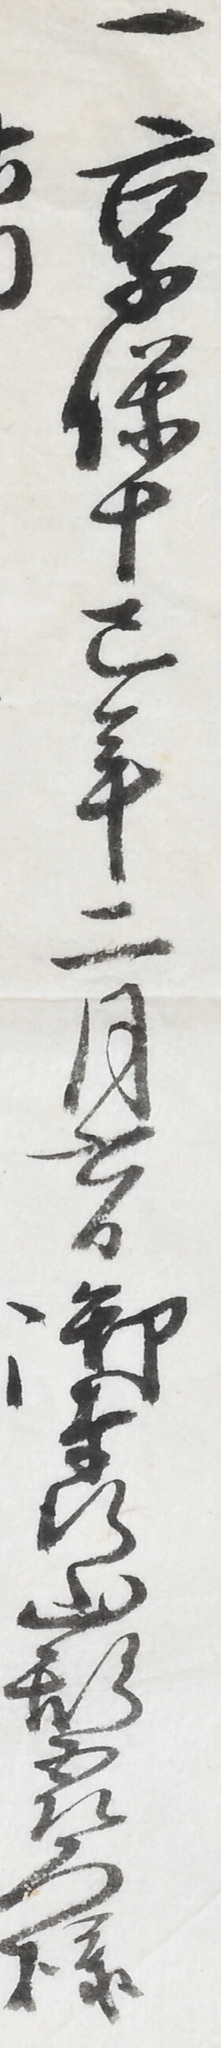一享保十巳年二月六日御奉行山形五左衛門様
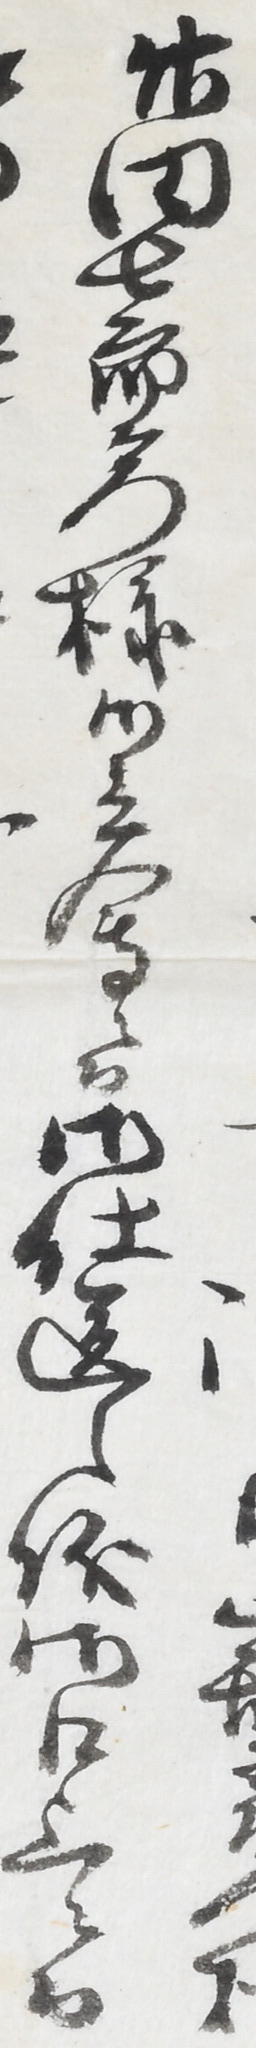竹田七郎右衛門様御立会ニ而御仕送之儀御口上ニ而
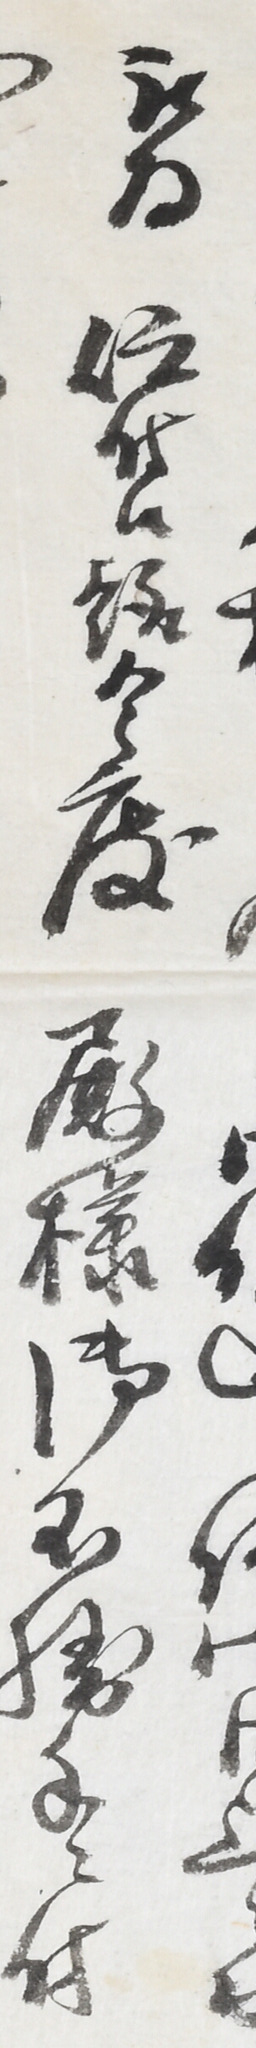被為仰付候趣今度殿様御不勝手ニ付
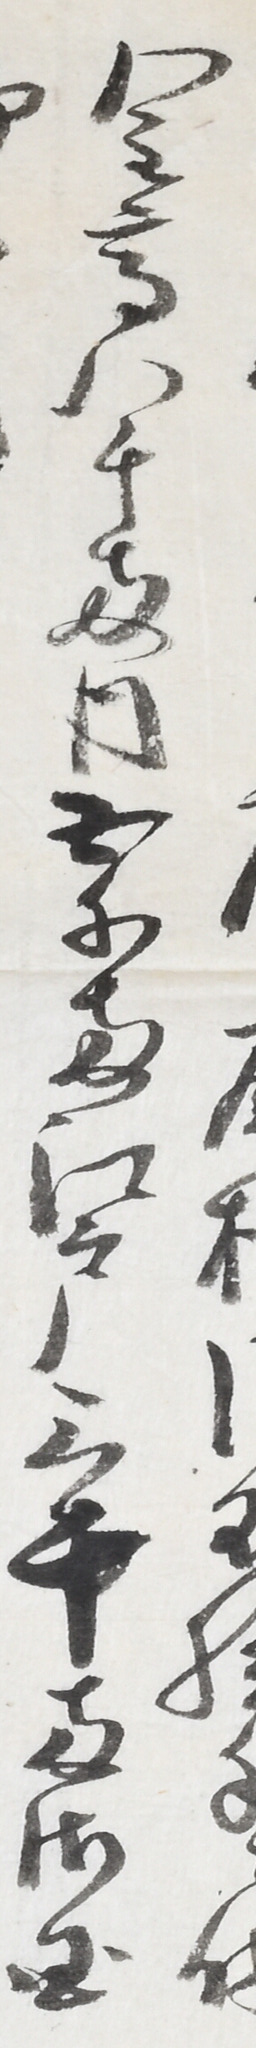金高八千両内五千両江戸三千両御国
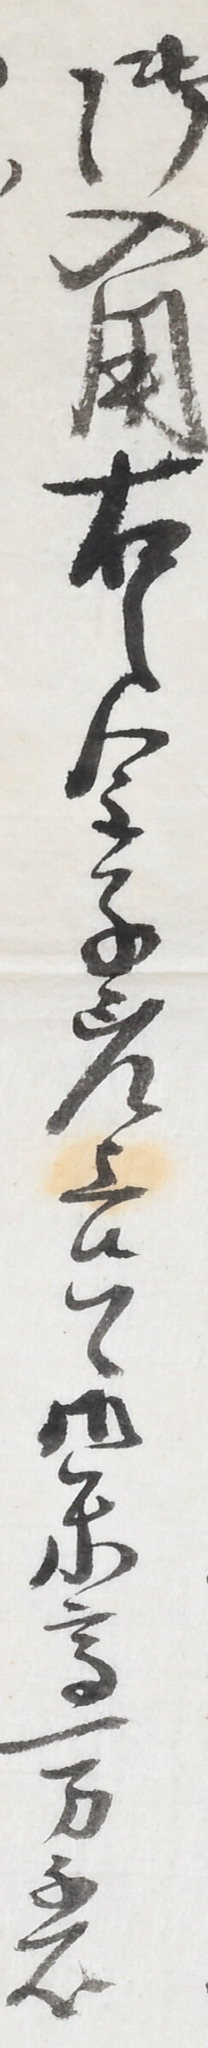御入用右之金子差上候ハゝ御米高一万千石
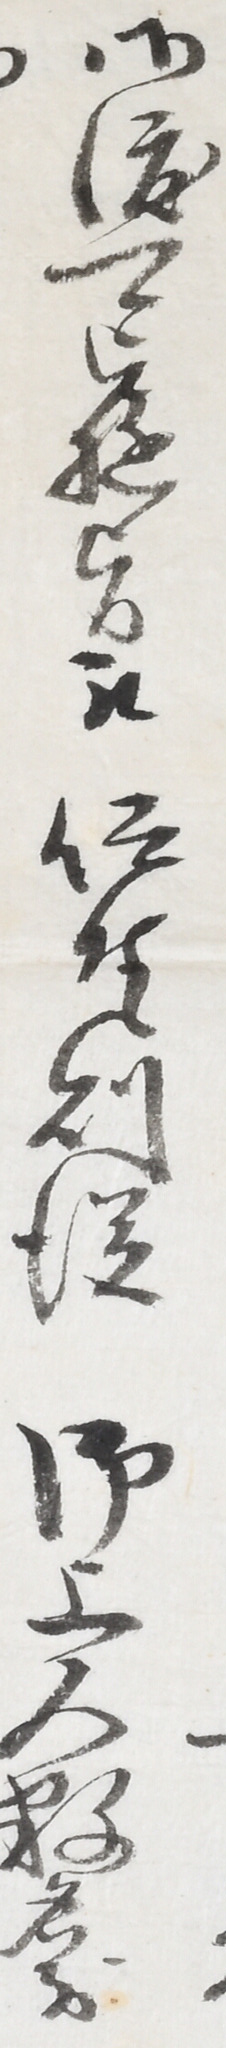御渡可被遊旨被仰付候則従御上人数名前
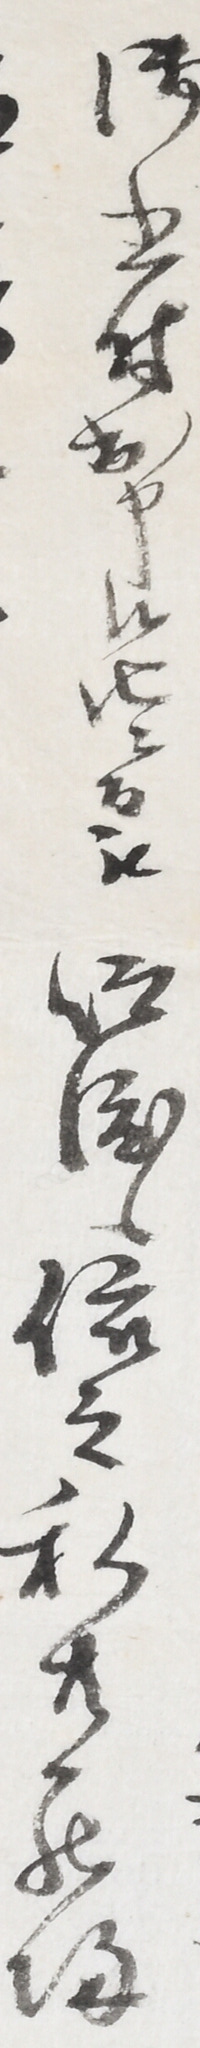御書付出申候由ニ而被仰渡候依之私共罷帰
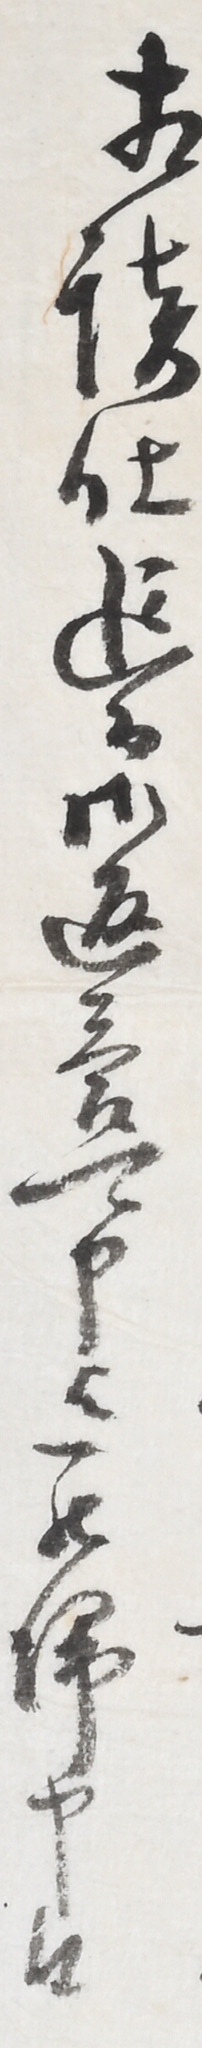相談仕追而御返答可申与罷帰申候
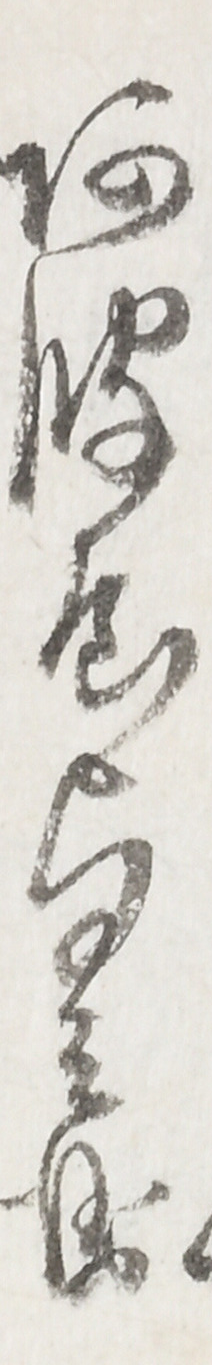阿波屋与兵衛
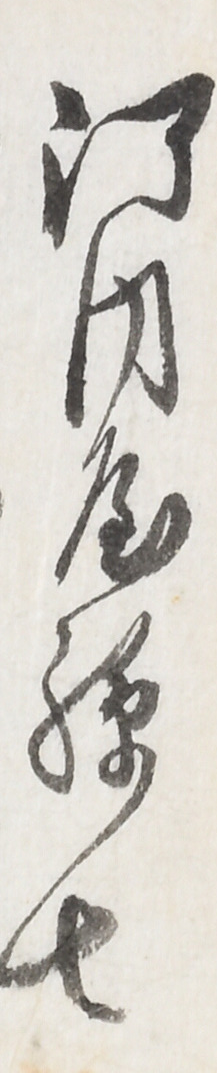河内屋孫七
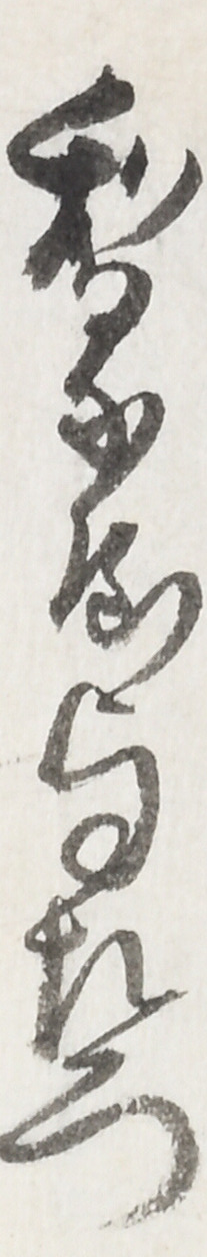和泉屋与左衛門
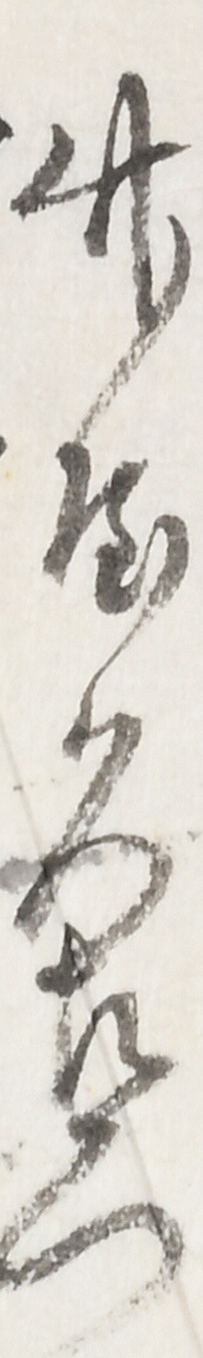竹屋久左衛門
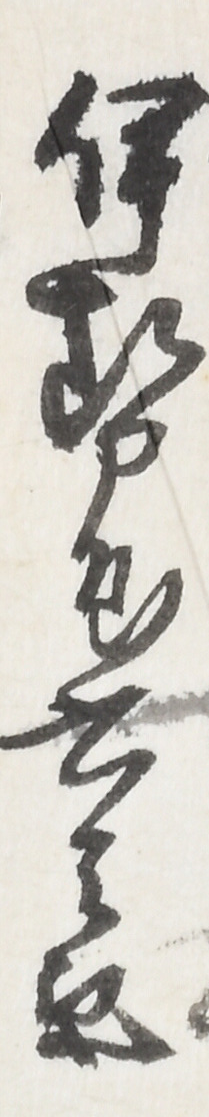伊勢屋六兵衛
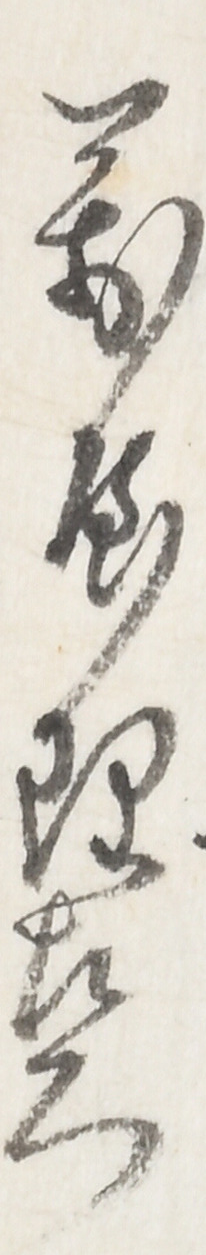萬屋理左衛門
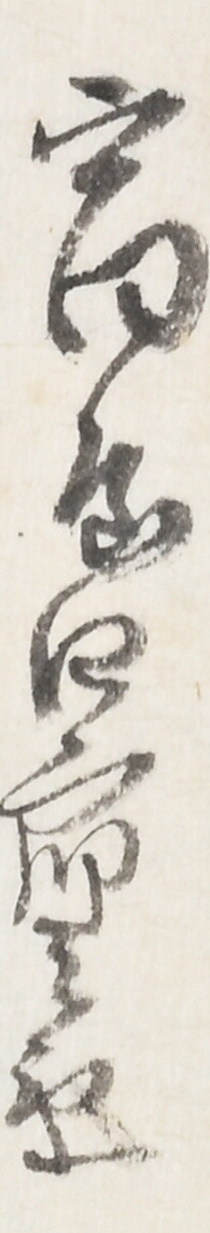富屋四郎兵衛
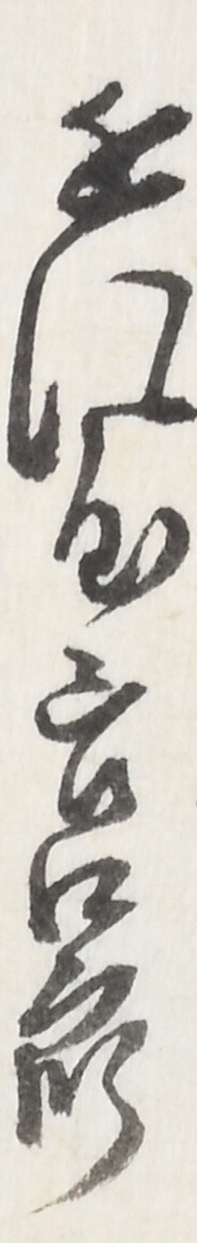近江屋善四郎
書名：覚
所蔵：伊那市立高遠町図書館・合同会社AMANE
